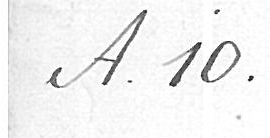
A. 10.
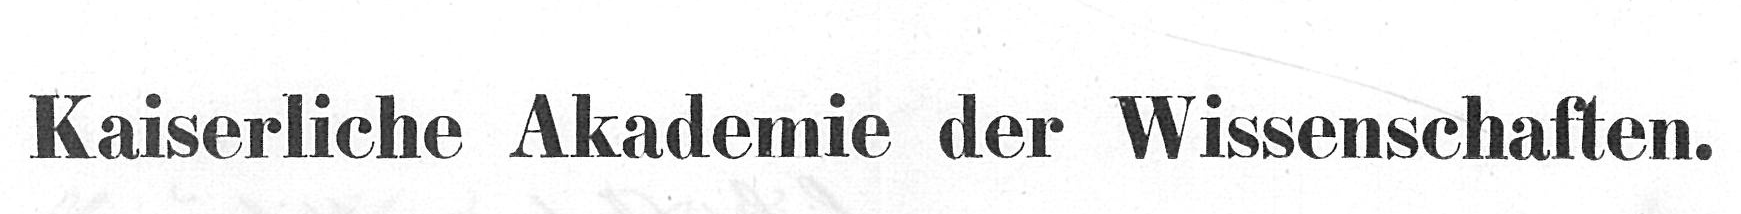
Kaiserliche Akademie der Wissenschaften.
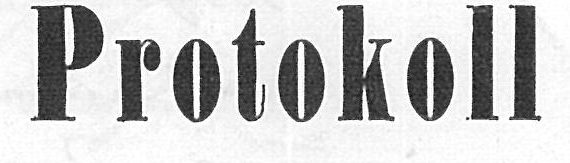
Protokoll
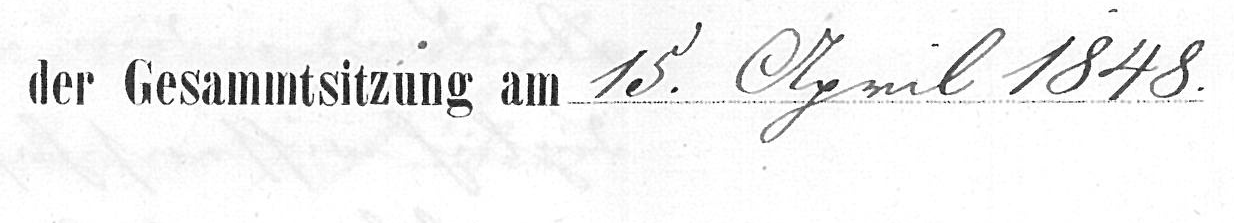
der Gesammtsitzung am 15. April 1848.
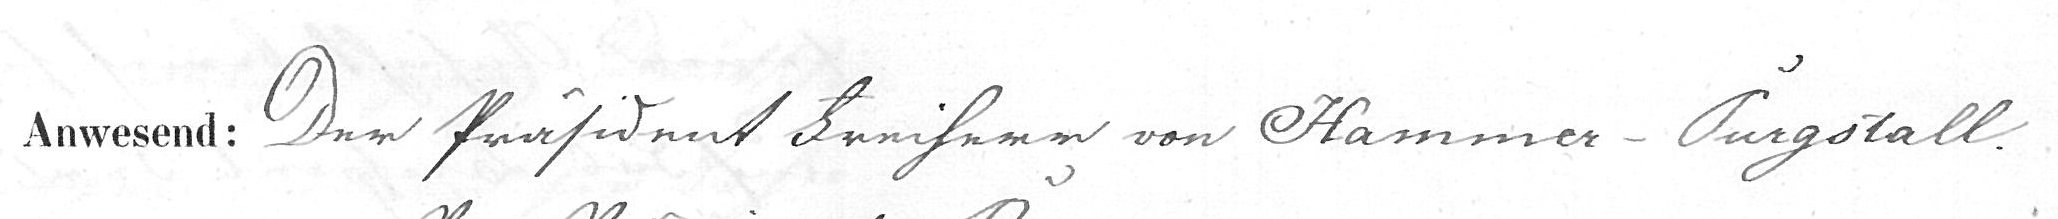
Anwesend: Der Präsident Freiherr von Hammer-Purgstall
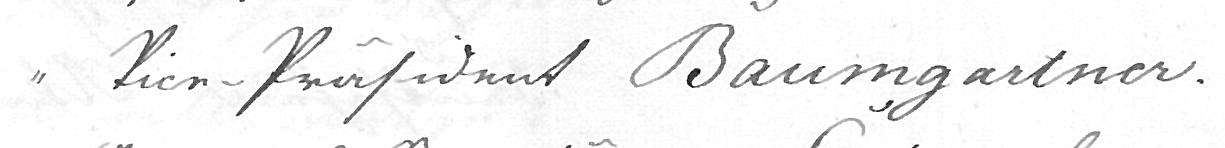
" Vice-Präsident Baumgartner.
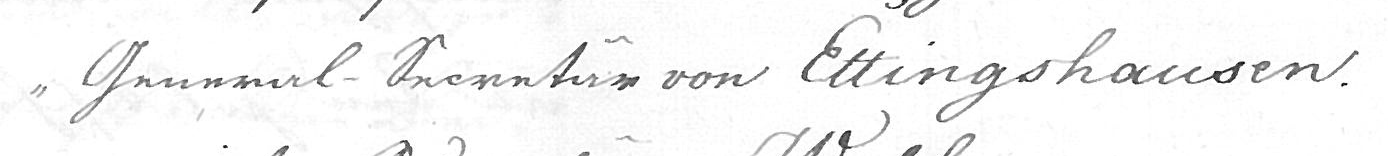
" General-Secretär von Ettingshausen.
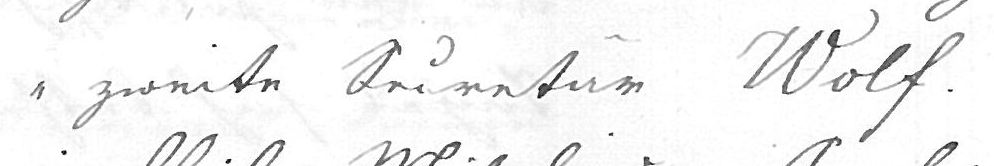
" zweite Secretär Wolf.
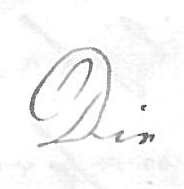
Die
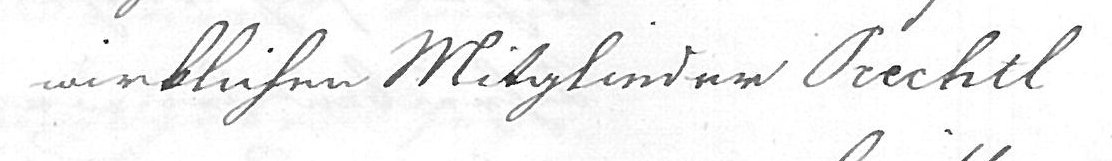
wirklichen Mitglieder Prechtl
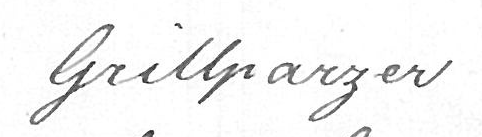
Grillparzer
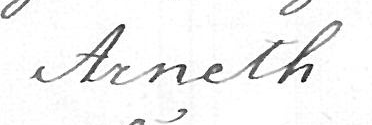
Arneth
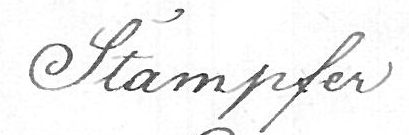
Stampfer
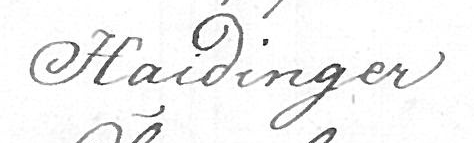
Haidinger
